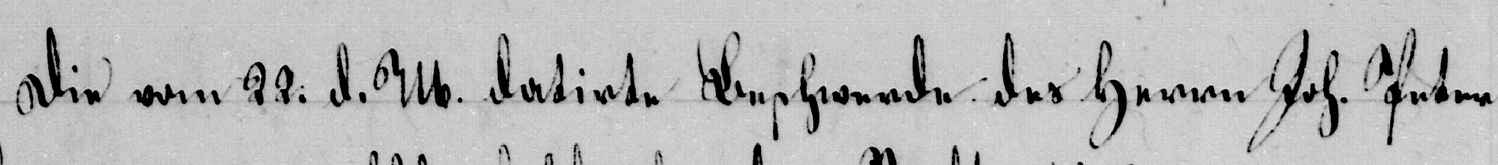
Die vom 22. d. M. datirte Beschwerde des Herrn Joh. Peter
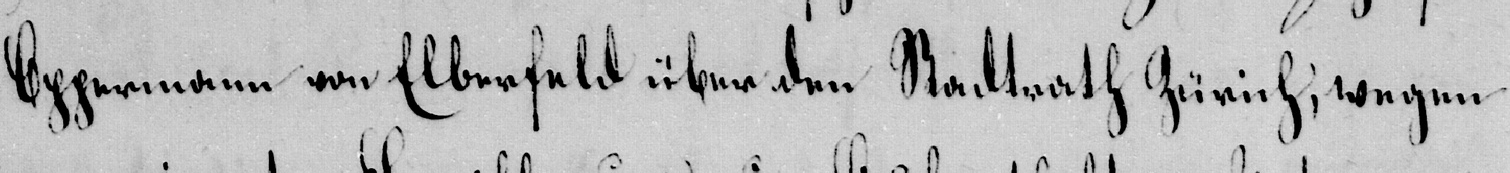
Oppermann von Elberfeld über den Stadtrath Zürich, wegen
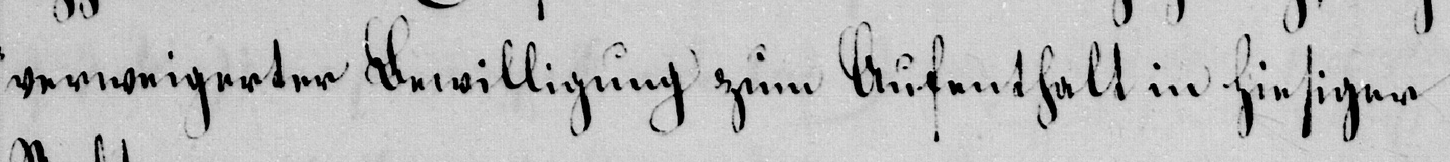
verweigerter Bewilligung zum Aufenthalt in hiesiger
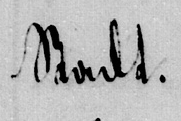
Stadt.
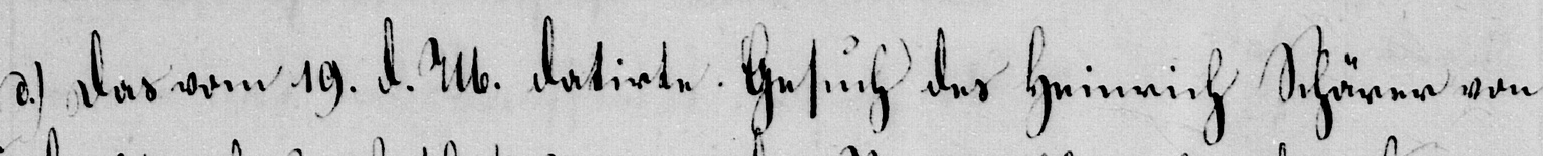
d.) Das vom 19. d. M. datirte Gesuch des Heinrich Schärer von
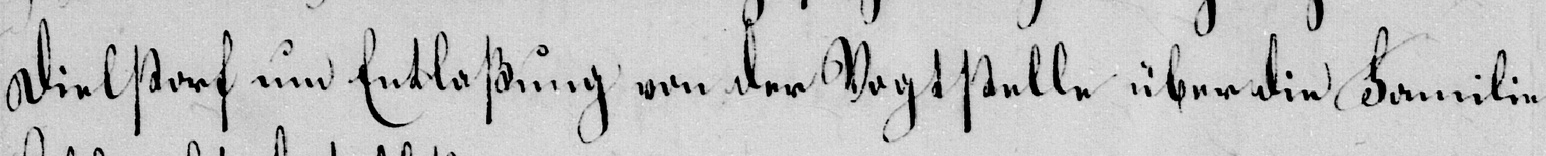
Dielstorf um Entlaßung von der Vogtstelle über die Familie
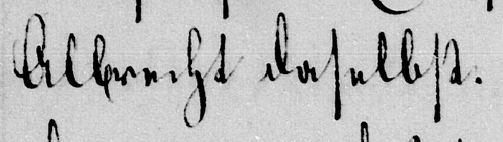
Albrecht daselbst.
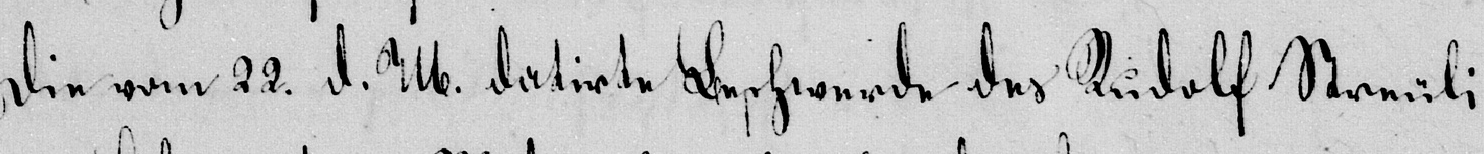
Die vom 22. d. M. datirte Beschwerde des Rudolf Streuli
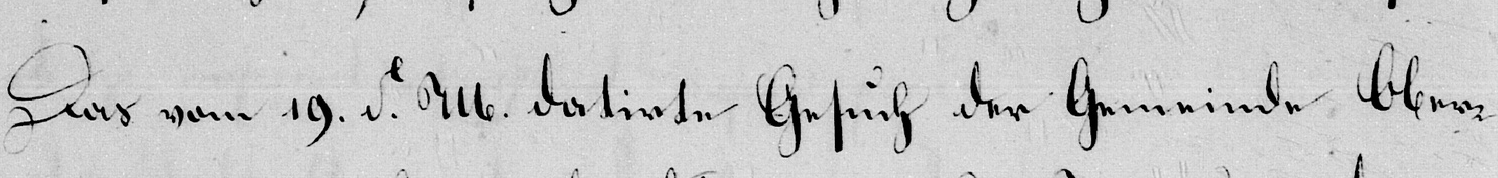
Das vom 19. d. M. datirte Gesuch der Gemeinde Ober¬
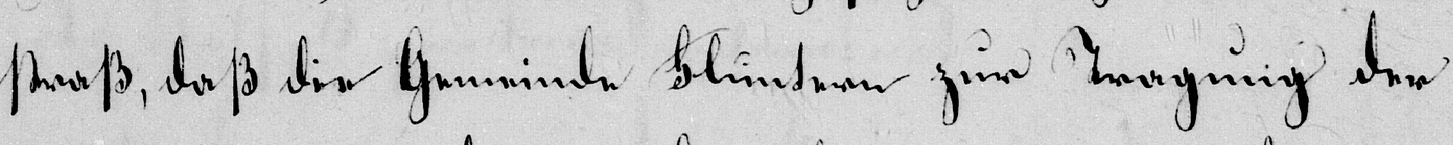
straß, daß die Gemeinde Fluntern zur Tragung der
